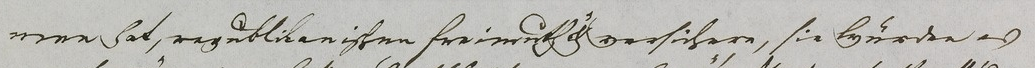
men hat, «republikanischen Freimuth» & versichern, sie würden es
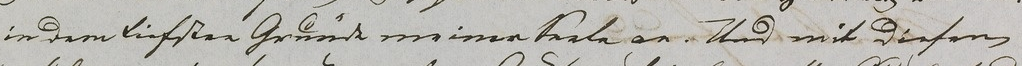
in dem tiefsten Grunde meiner Seele an. Und mit diesen
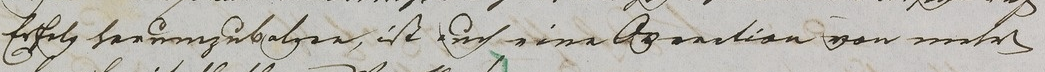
Erfolg herumzubalgen, ist auch eine Operation von mehr
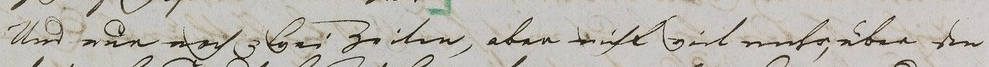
Und nun noch zwei Zeilen, aber nicht viel mehr, über den
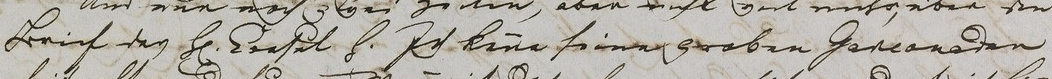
Brief des Hrn. Consul H. Ich kenne seine groben Garconaden
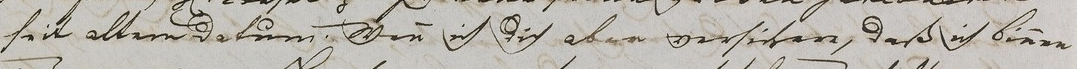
seit altem Datum. Wenn ich Dich aber versichere, daß ich binnen
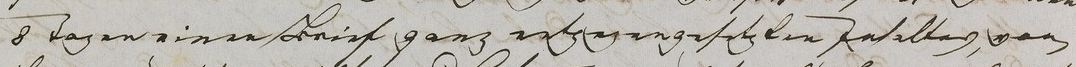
8 Tagen einen Brief ganz entgegengesetzten Inhaltes, von
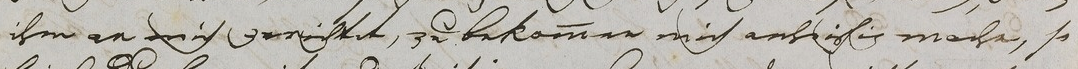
ihm an mich gerichtet, zu bekommen mich anheischig mache, so
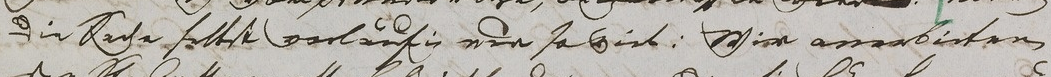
die Sache selbst vorläufig nur so viel: Wir anerbieten
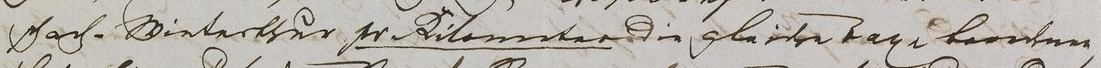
schach–Winterthurpr Kilometer die gleiche Taxe berechnen,
